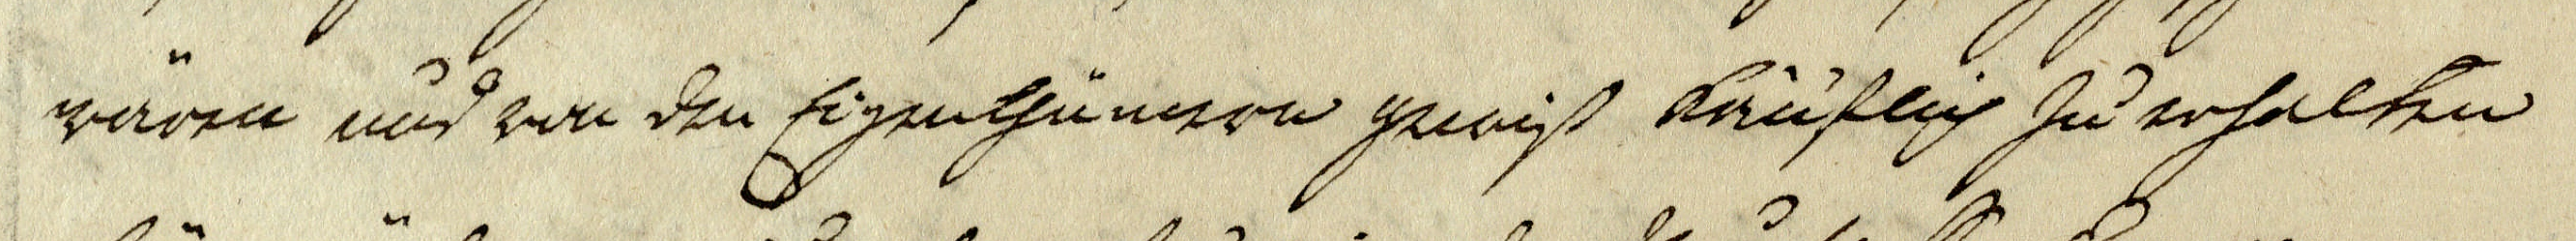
wären und von den Eigenthümern gewiß käuflich zu erhalten
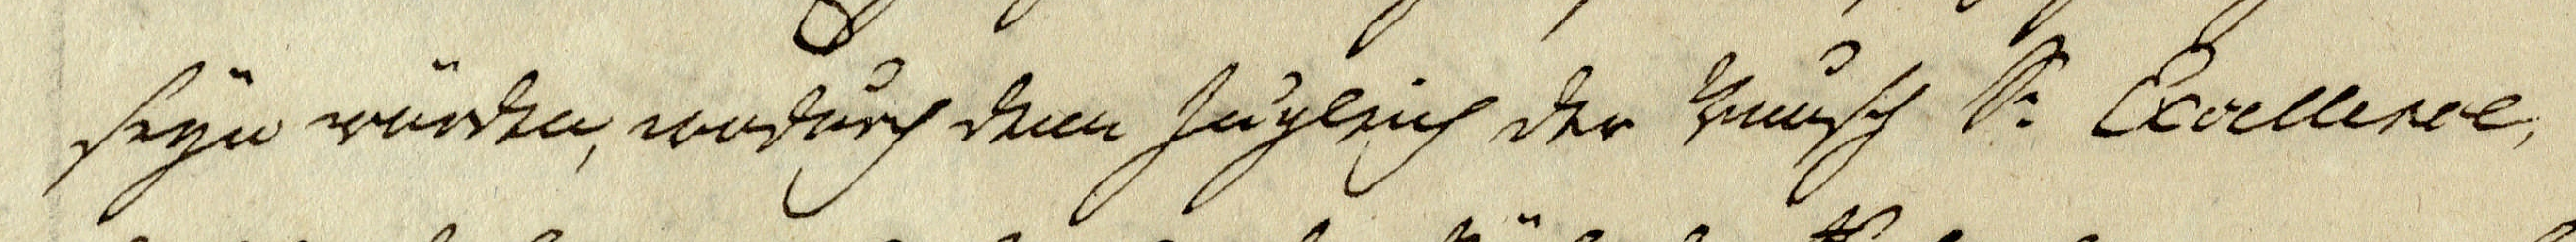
seÿn würden, wodurch denn zugleich der Wunsch Sr. Excellence,
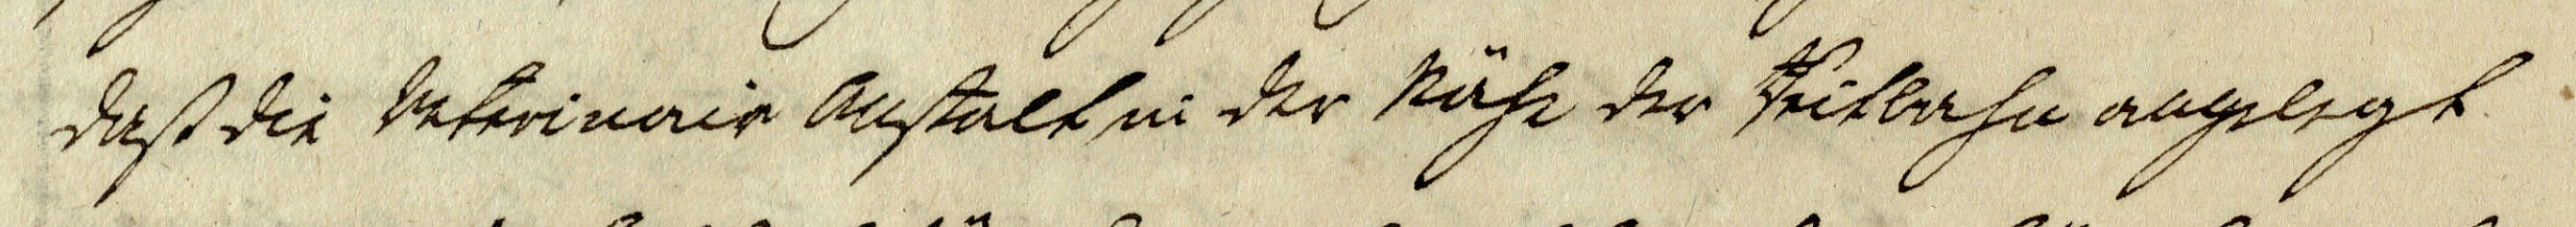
daß die Veterinair Anstalt in der Nähe der Reitbahn angelegt
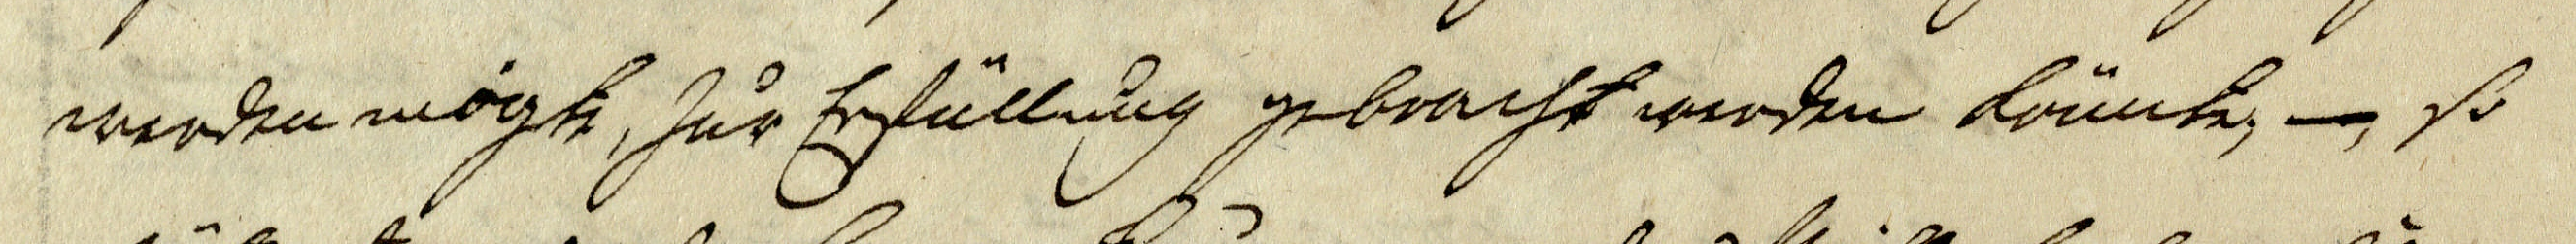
werden mögte, zur Erfüllung gebracht werden könnte, so
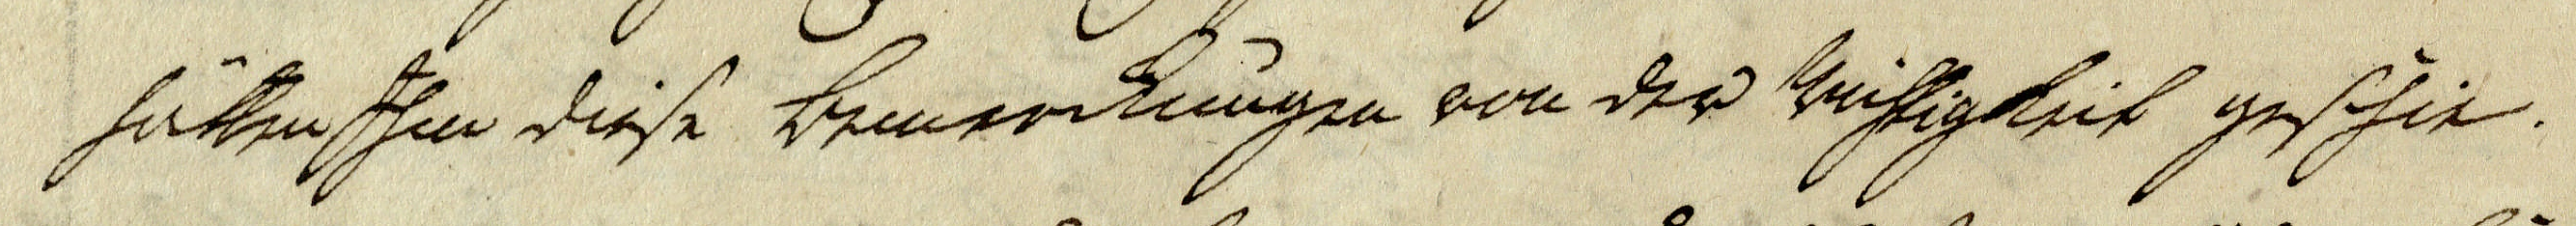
hätten Ihm diese Bemerckungen von der Wichtigkeit geschie¬
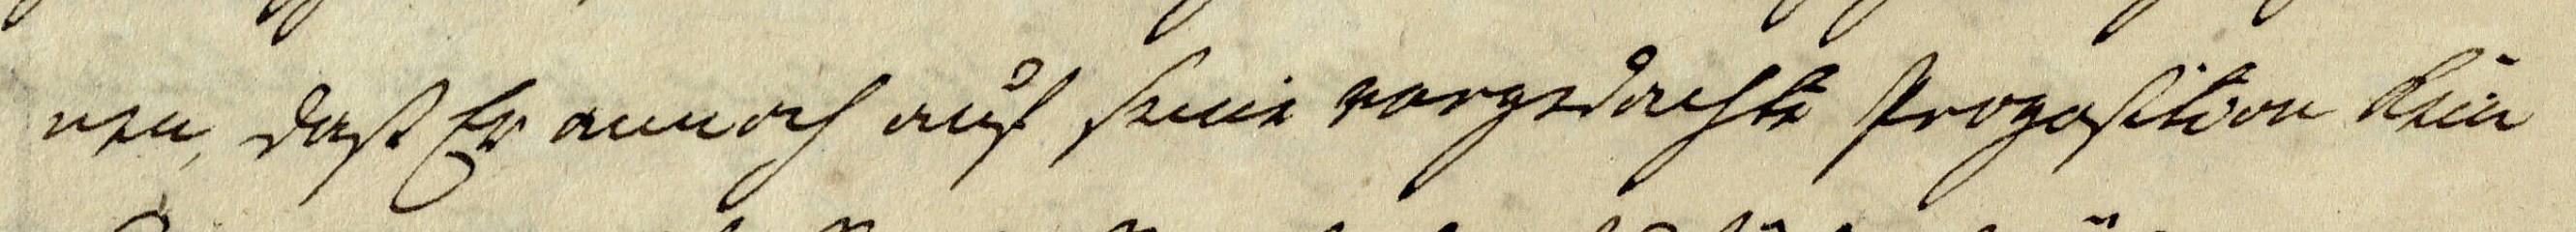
nen, daß Er annoch auf seine vorgedachte Proposition kein
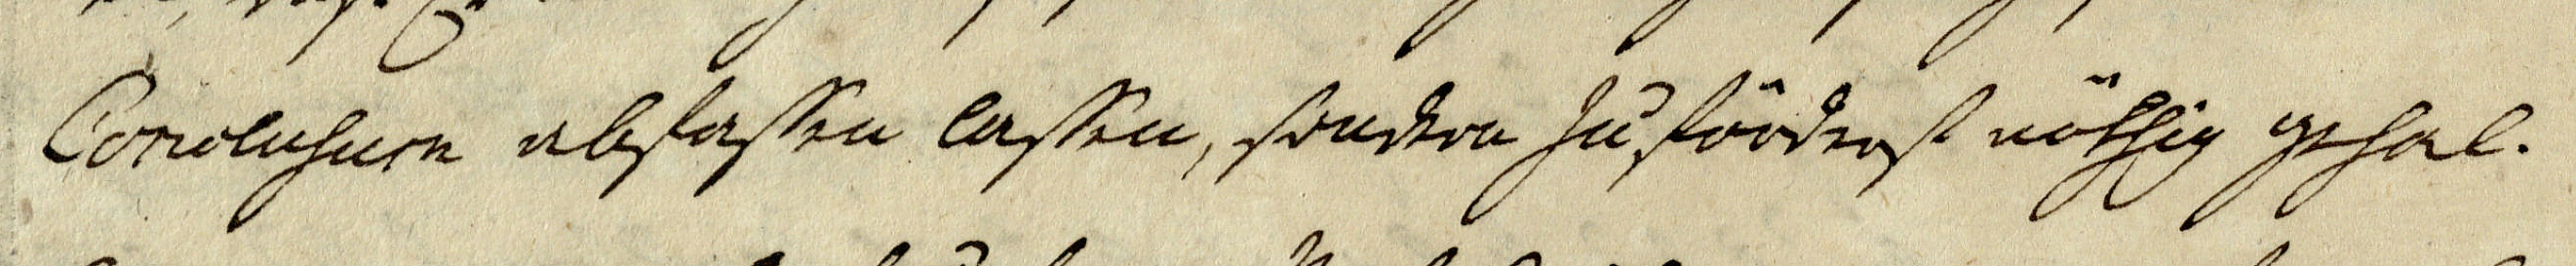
Conclusum abfassen lassen, sondern zuförderst nöthig gehal¬
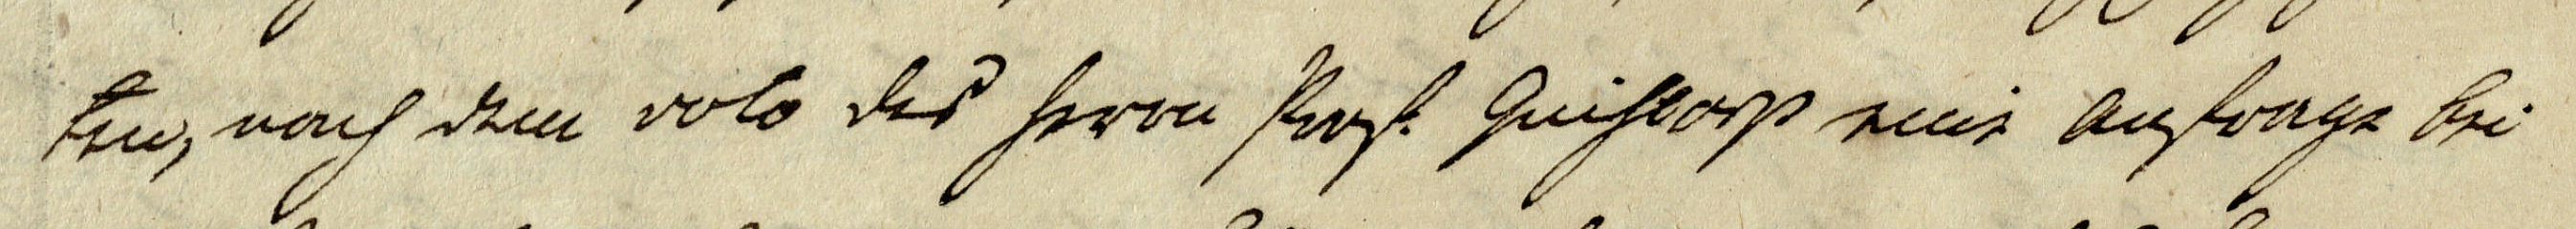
ten, nach dem voto des Herrn Prof. Quistorp eine Anfrage bei
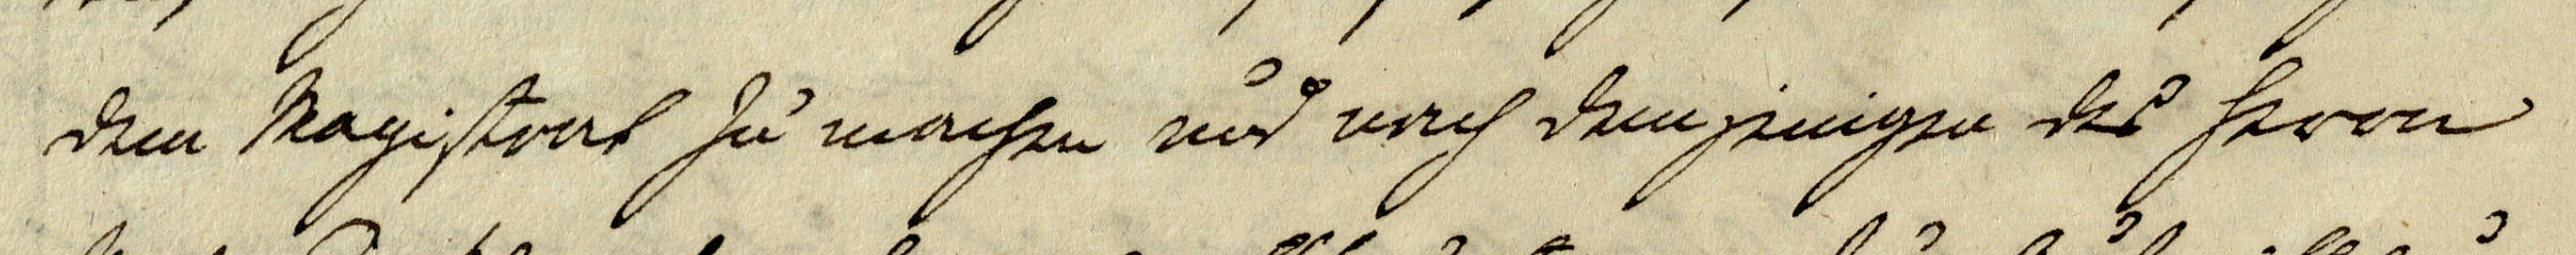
dem Magistrat zu machen und nach demjenigen des Herrn
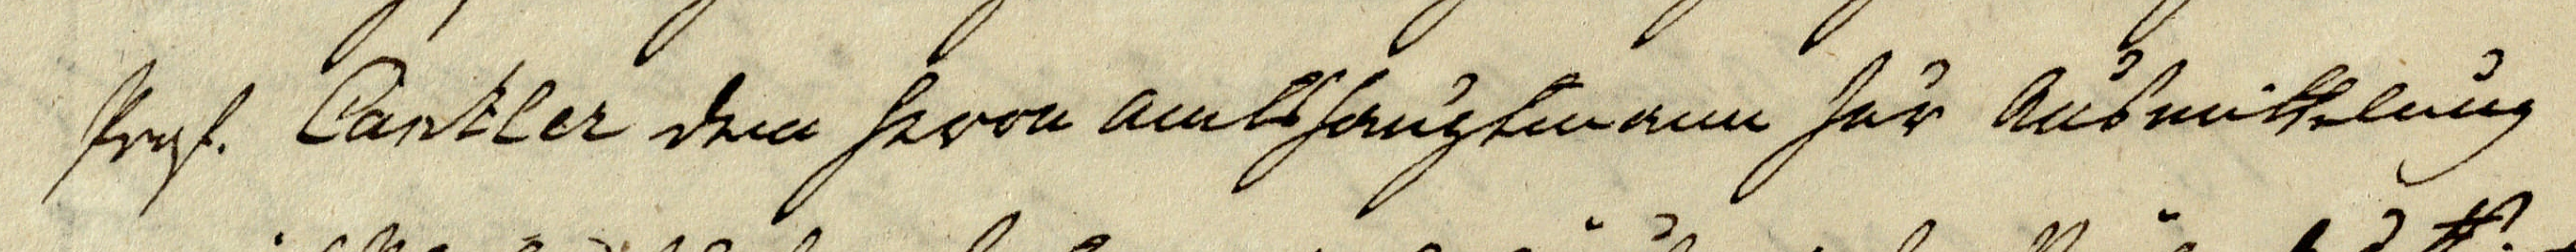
Prof. Canzler dem Herrn Amtshauptmann zur Ausmittelung
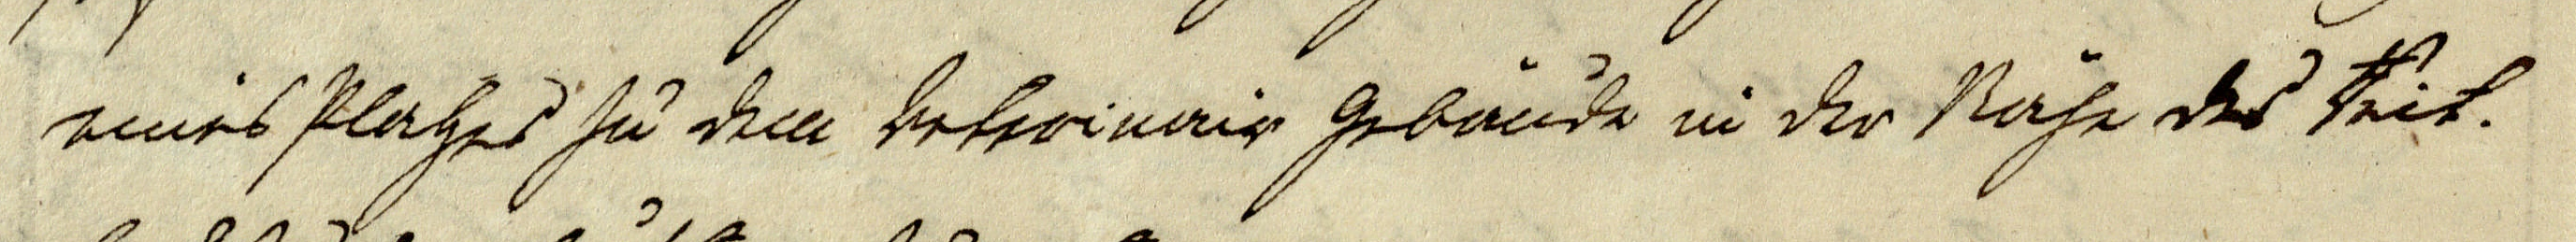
eines Platzes zu dem Veterinair Gebäude in der Nähe des Reit¬
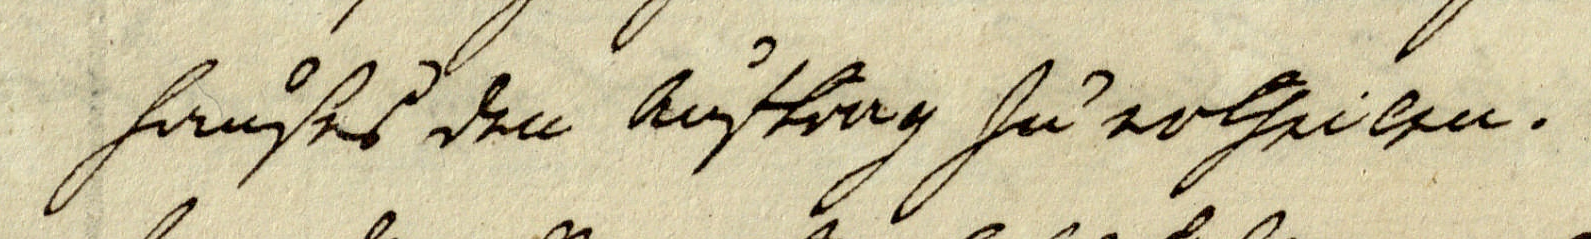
hauses den Auftrag zu ertheilen.
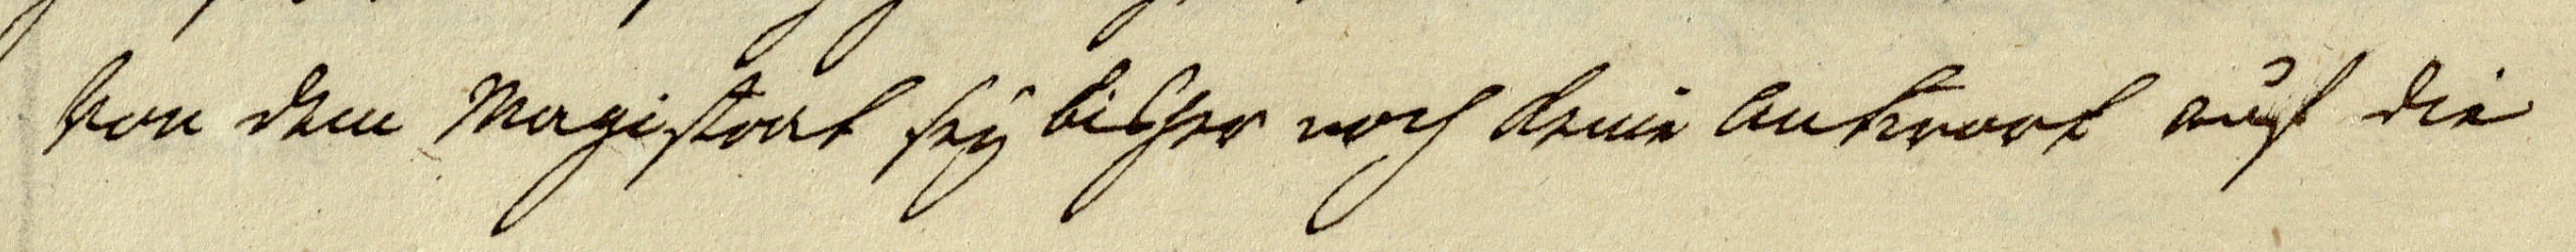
Von dem Magistrat seÿ bisher noch keine Antwort auf die
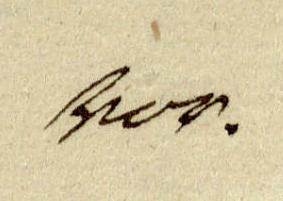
vor¬
